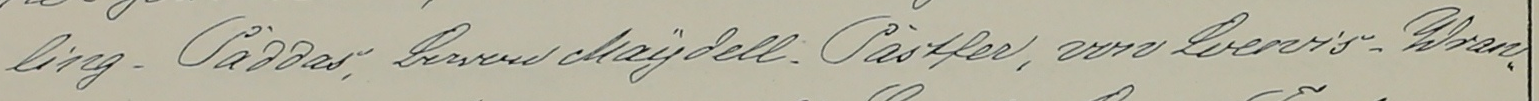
ling-Paddas, Baron Maydell-Pastfer, von Loewis-Wran-
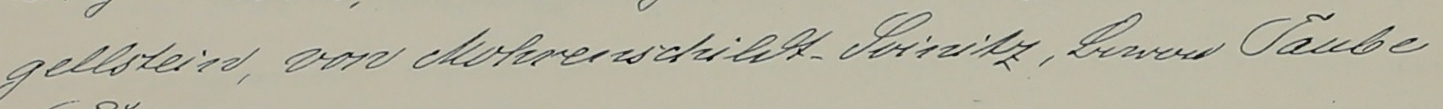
gelstein, von Mohrenschildt-Soinitz, Baron Taube-
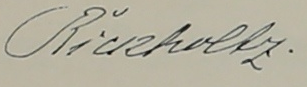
Rickholtz.
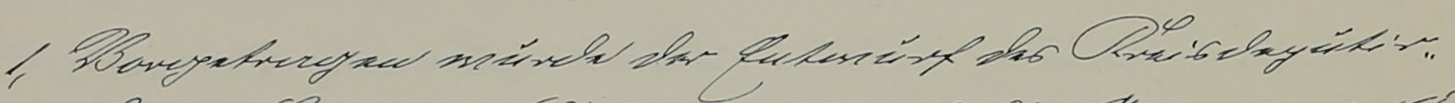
1. Vorgetragen wurde der Entwurf des Kreisdeputir-
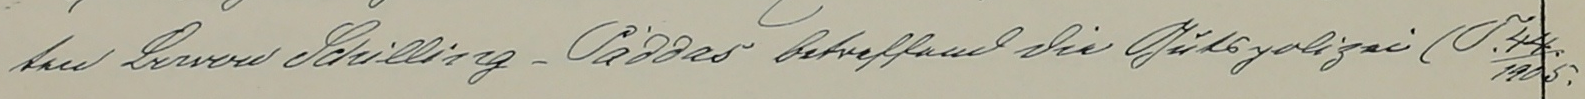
ten Baron Schilling-Paddas betreffend die Gutspolizei (T.44/1905.
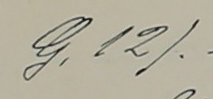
G.12).
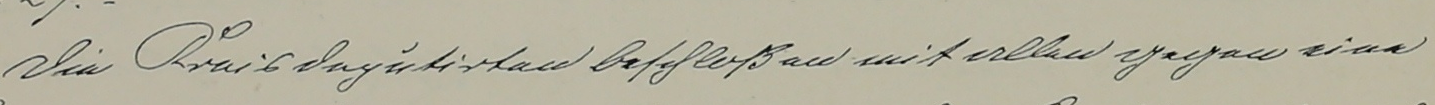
Die Kreisdeputirten beschloßen mit allen gegen eine
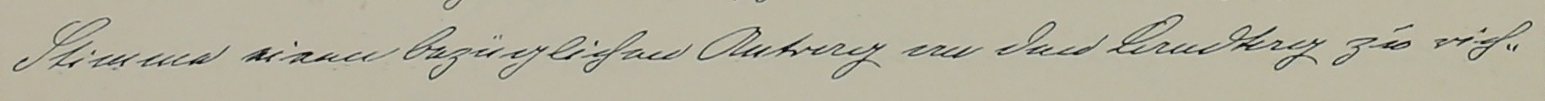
Stimme einen bezüglichen Antrag an den Landtag zu rich-
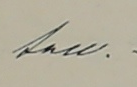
ten.
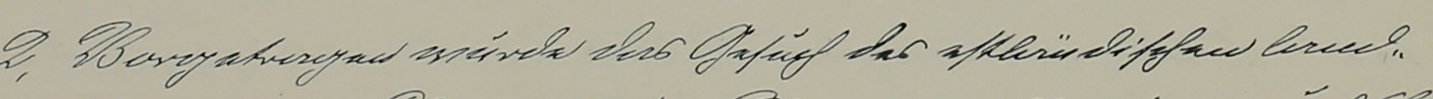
2. Vorgetragen wurde das Gesuch des estländischen land-
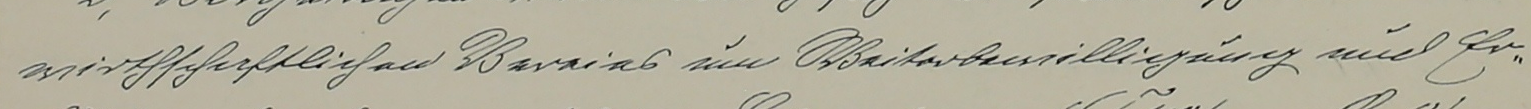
wirtschaftlichen Vereins um Weiterbewilligung und Er-
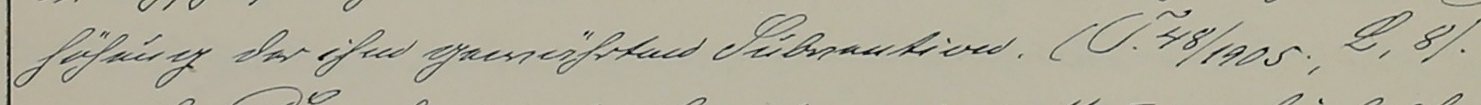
höhung der ihm gewährten Subvention. (T.48/1905; L.8).
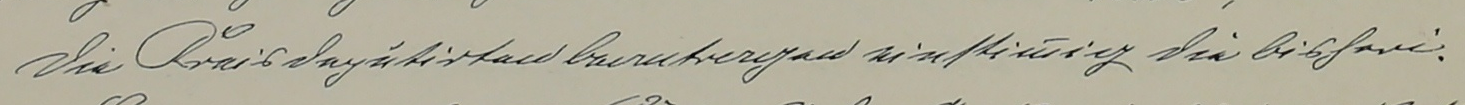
Die Kreisdeputirten beantragen einstimmig die bisheri-
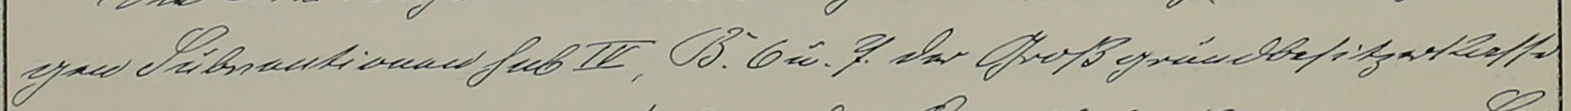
gen Subventionen sub IV, B. 6 u. 7. der Großgrundbesitzerkasse
